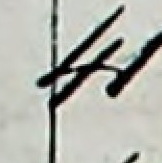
41
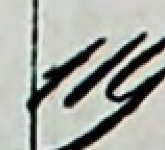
119
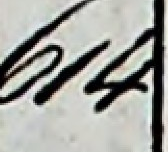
614
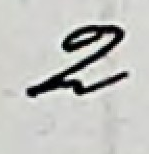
2
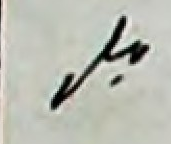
do
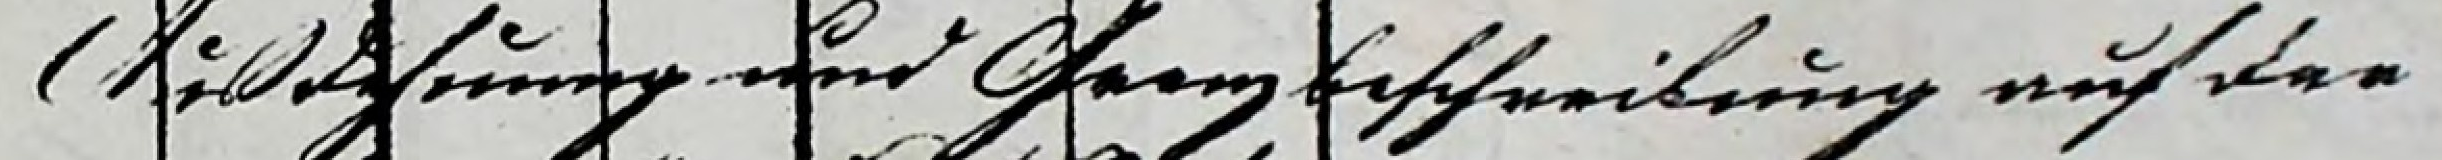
Ausdehnung und Grenzbeschreibung auf den
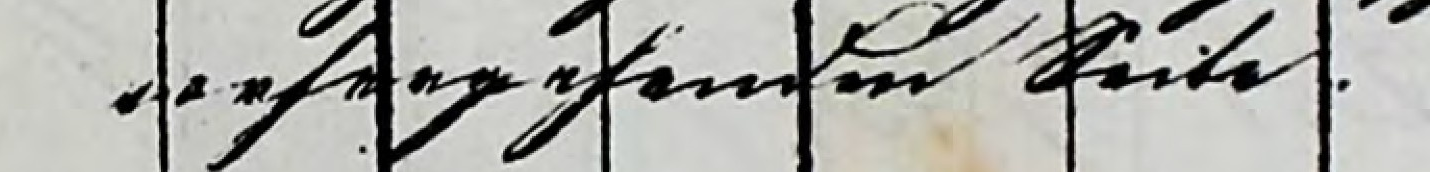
vorhergehenden Seite.
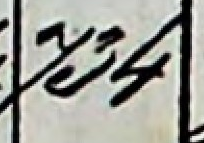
734
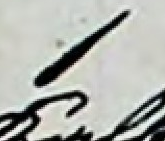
1
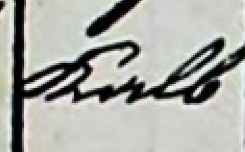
Kalb
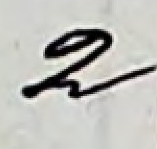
22
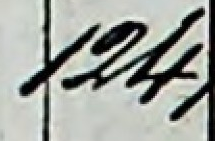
124
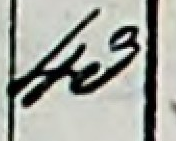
43
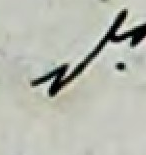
do
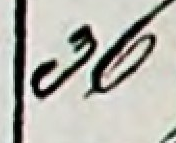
36
